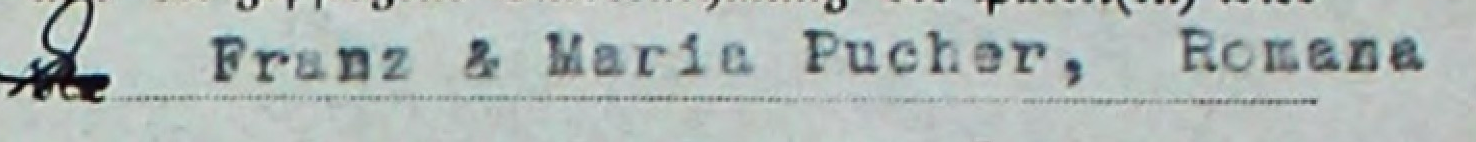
Franz & Maria Pucher, Romana
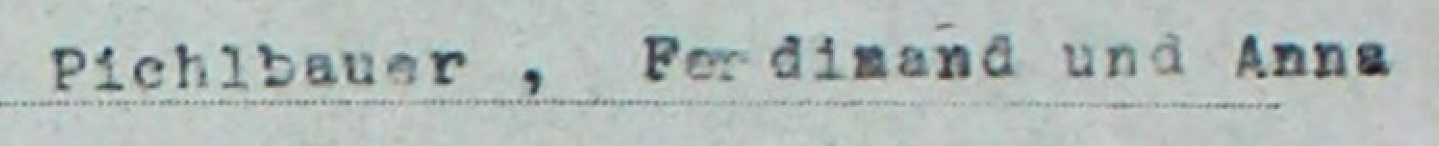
Pichlbauer, Ferdinand und Anna
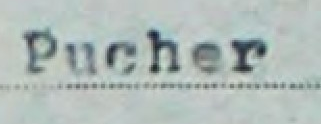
Pucher
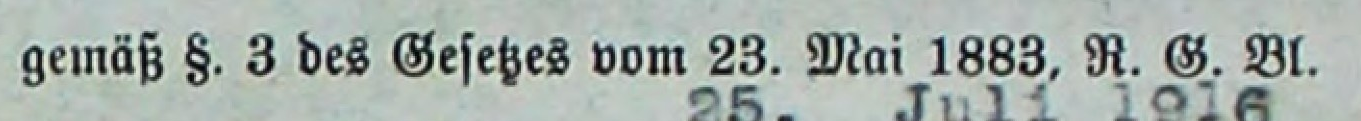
gemäß §. 3 des Gesetzes vom 23. Mai 1883, R. G. Bl.
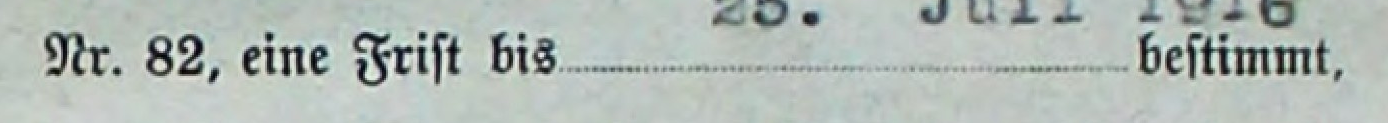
Nr. 82, eine Frist bis 25. Juli 1916 bestimmt,
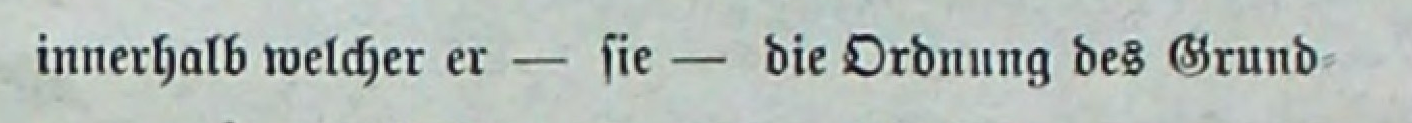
innerhalb welcher er — sie — die Ordnung des Grund„
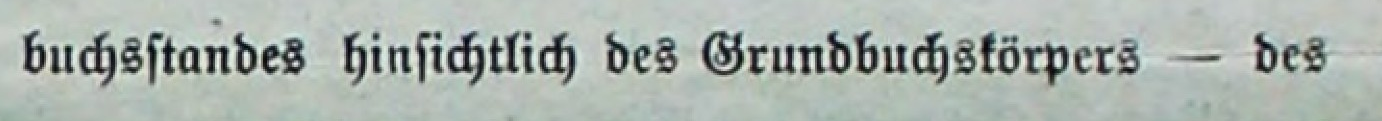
buchstandes hinsichtlich des Grundbuchstörpers — des
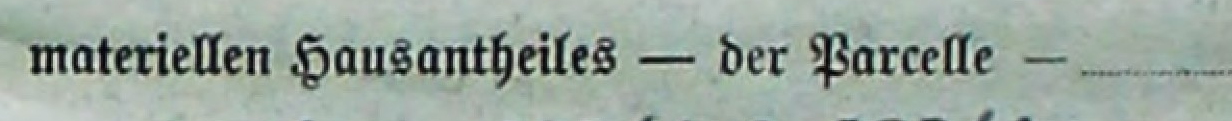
materiellen Hausantheiles — der Parcelle —
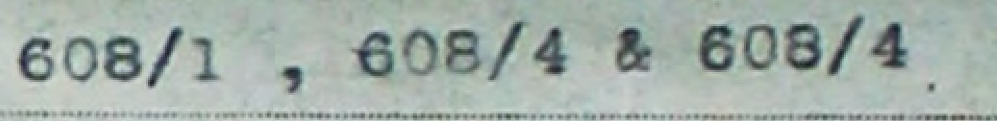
608/1, 608/4 & 608/4
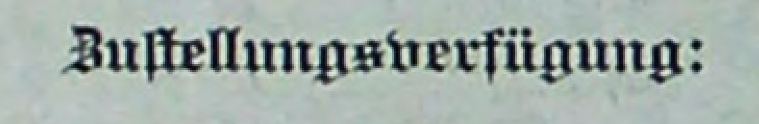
Aufstellungsverfügung:
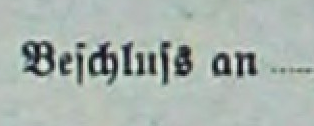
Beschluss an
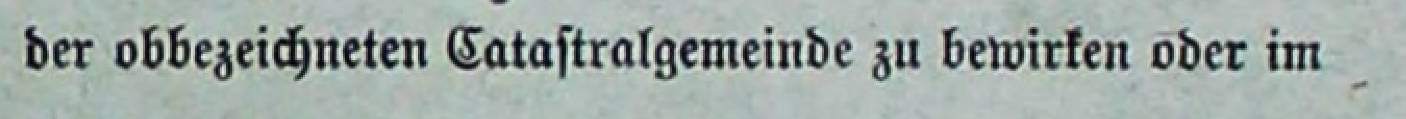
der obbezeichneten Catastralgemeinde zu bewirken oder im
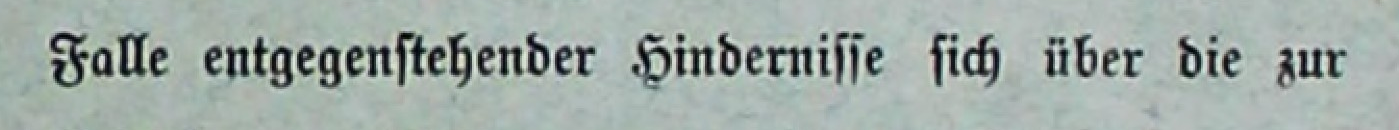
Falle entgegenstehender Hindernisse sich über die zur
